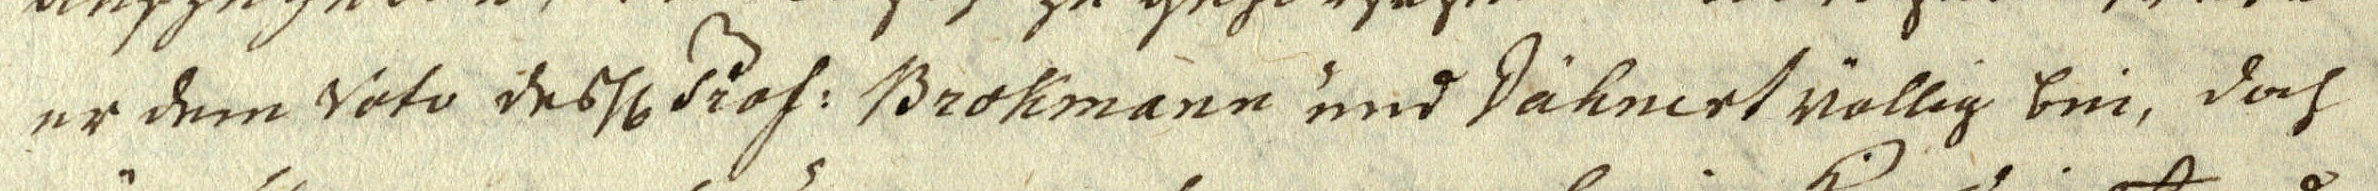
er dem Voto der h Prof: Brokmann und Dähnert völlig bei, doch
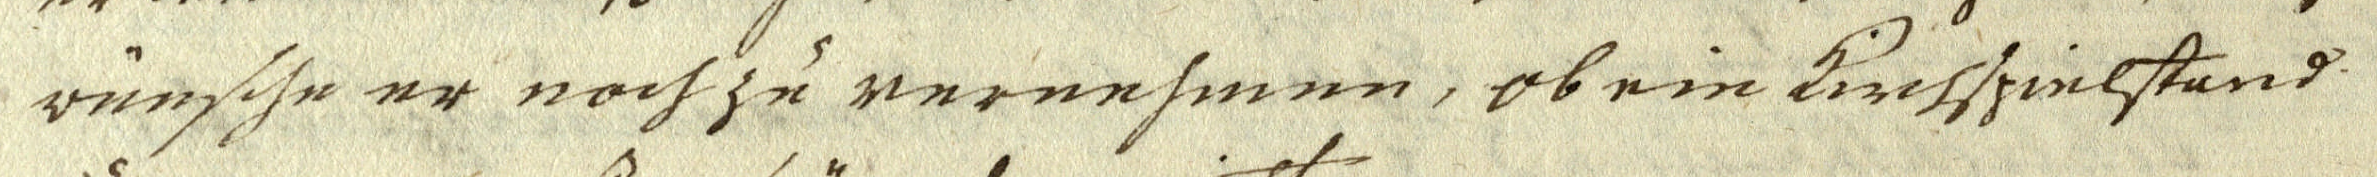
wünsche er noch zu vernehmen, ob ein Kirchspielstand
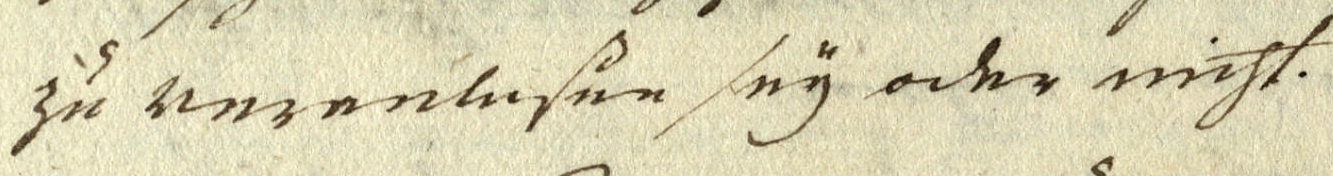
zu veranlaßen seÿ oder nicht.
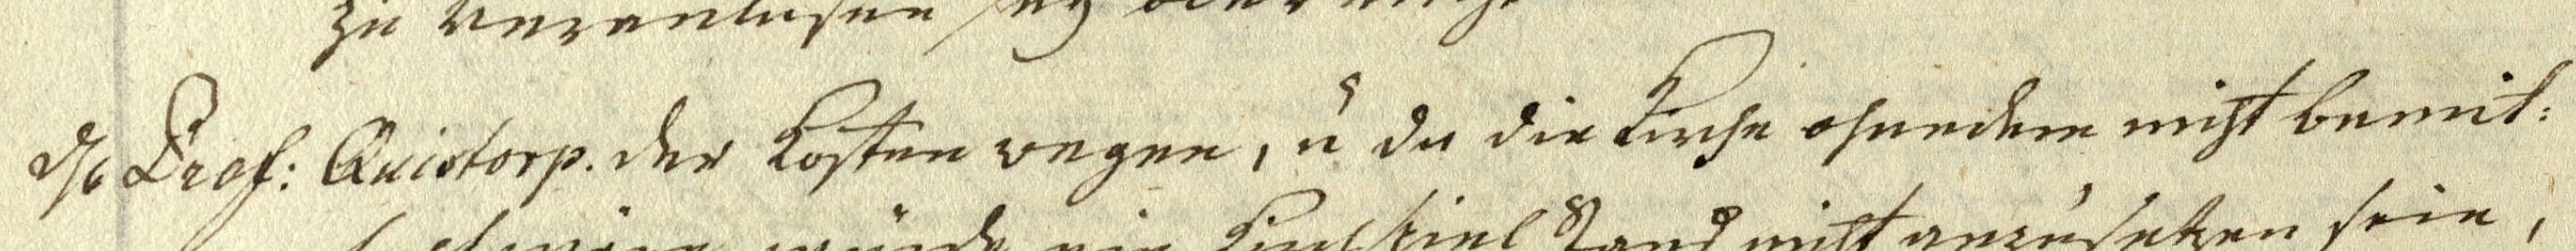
dh. Prof. Quistorp. der Kosten wegen, u da die Kirche ohnedem nicht bemit¬
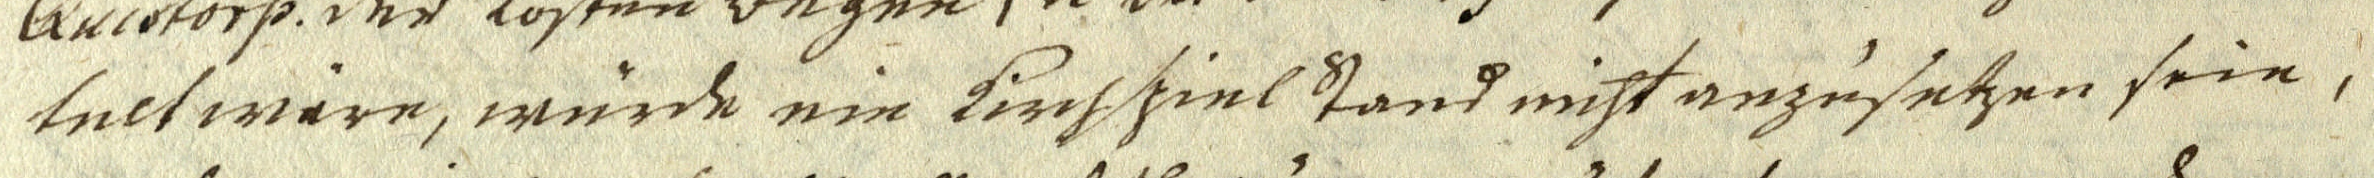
telt wäre, würde ein Kirchspielstand nicht anzusetzen sein,
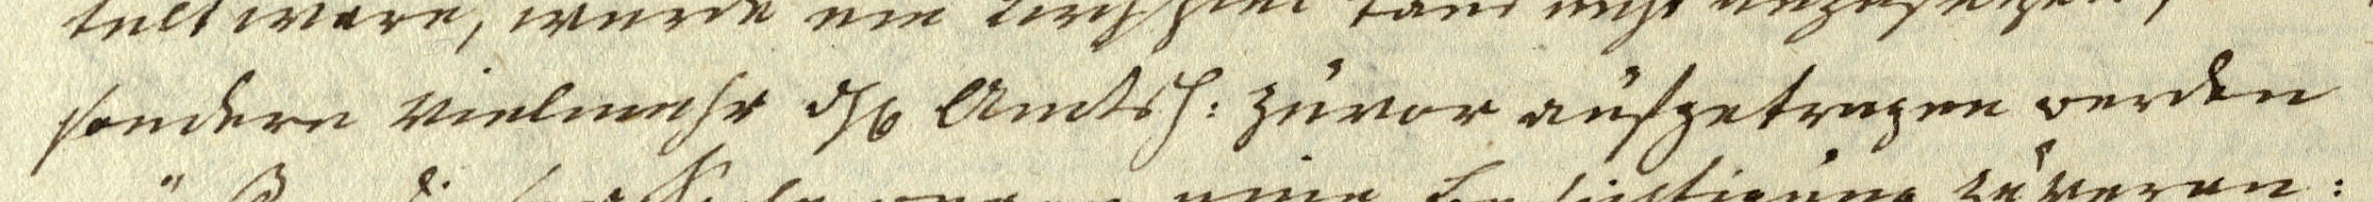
sondern vielmehr dh Amtsh. zuvor aufgetragen werden
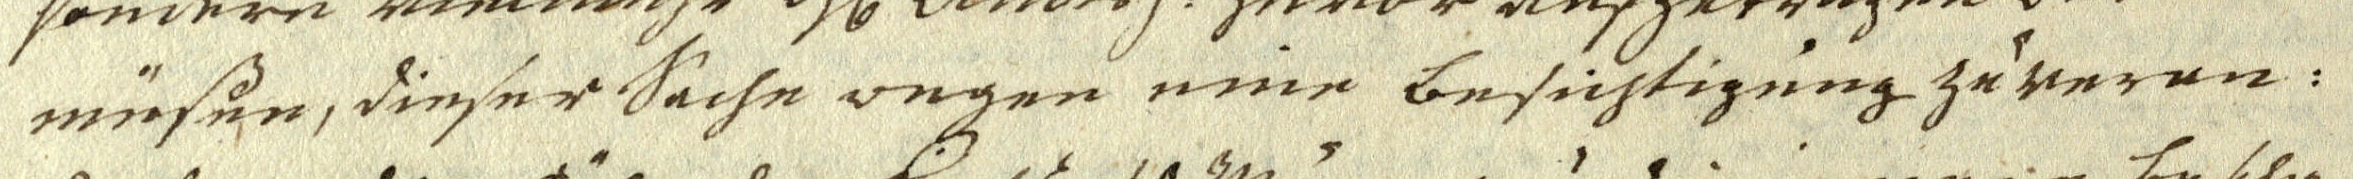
müßen, dieser Sache wegen einen Besichtigung zu veran¬
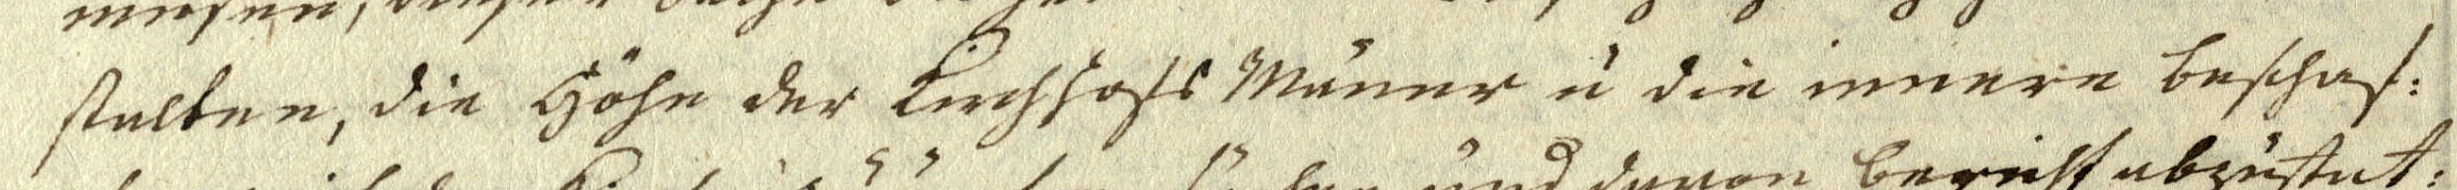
stalten, die Höhe der Kirchchhofs Mäner u die innere Beschaf¬
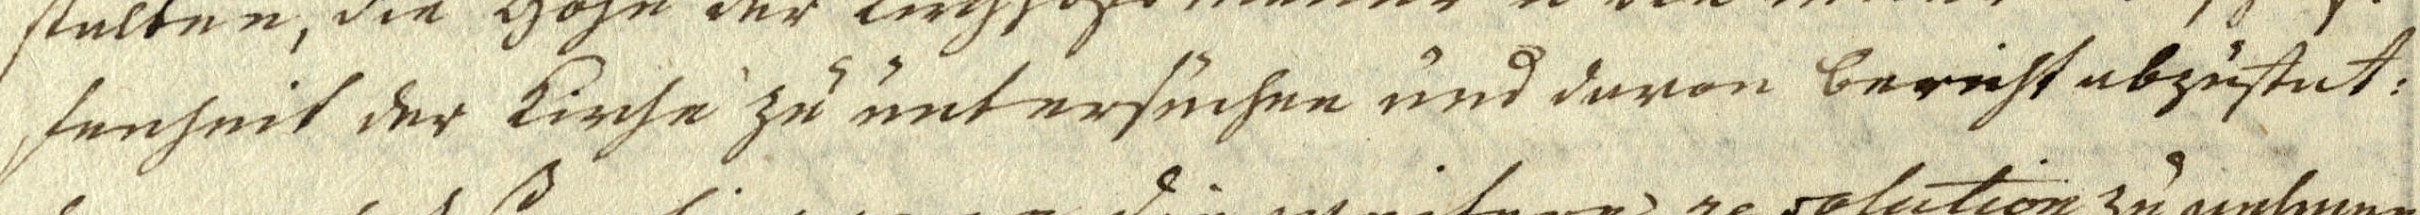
fenheit der Kirche zu untersuchen und davon Bericht abzustat¬
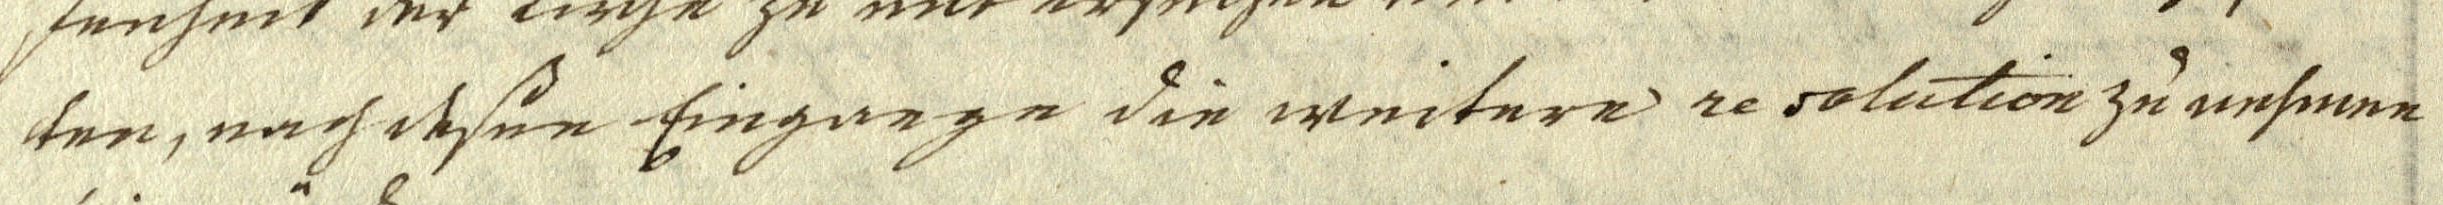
ten, nach deßen Eingange die weitere resolution zu nehmen
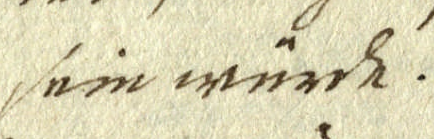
sein würde.
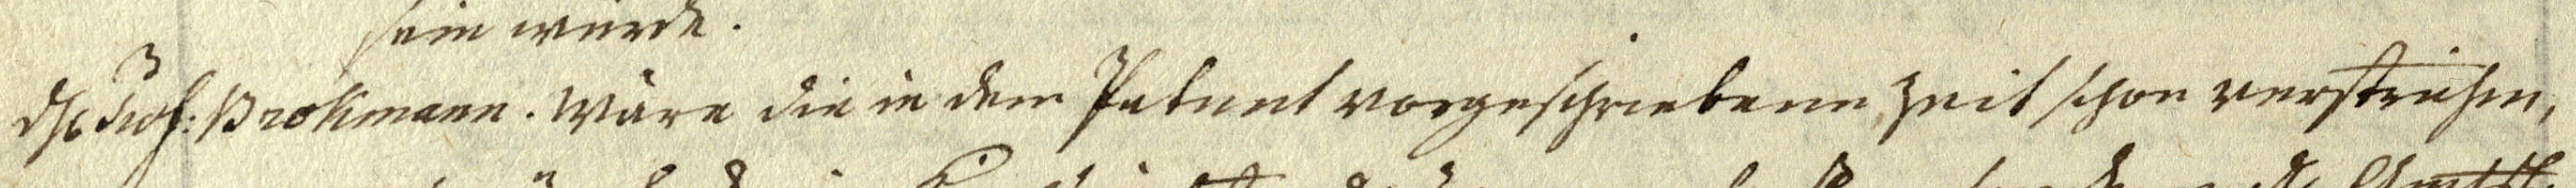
dh Prof. Brokmann. Wäre die in dem Patent vorgeschriebene Zeit schon verstrichen,
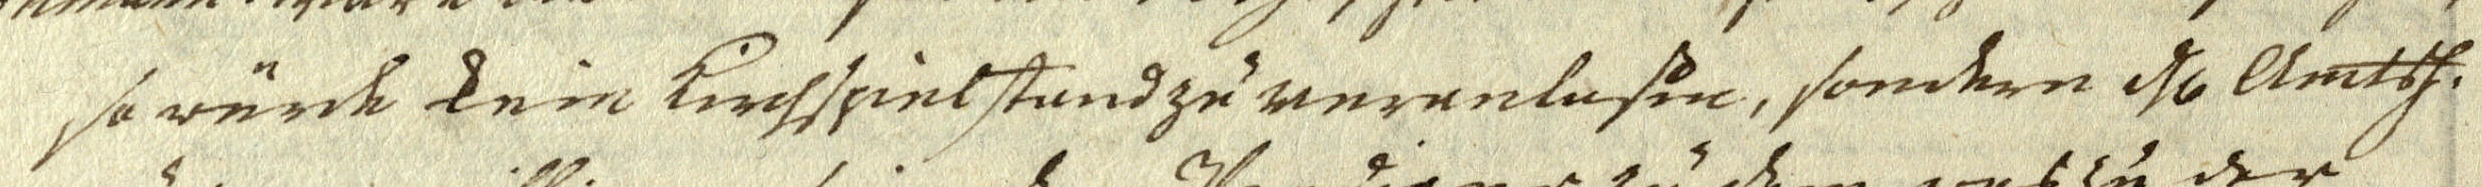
so würde kein Kirchspielstand zu veranlaßen, sondern dh Amtsh.
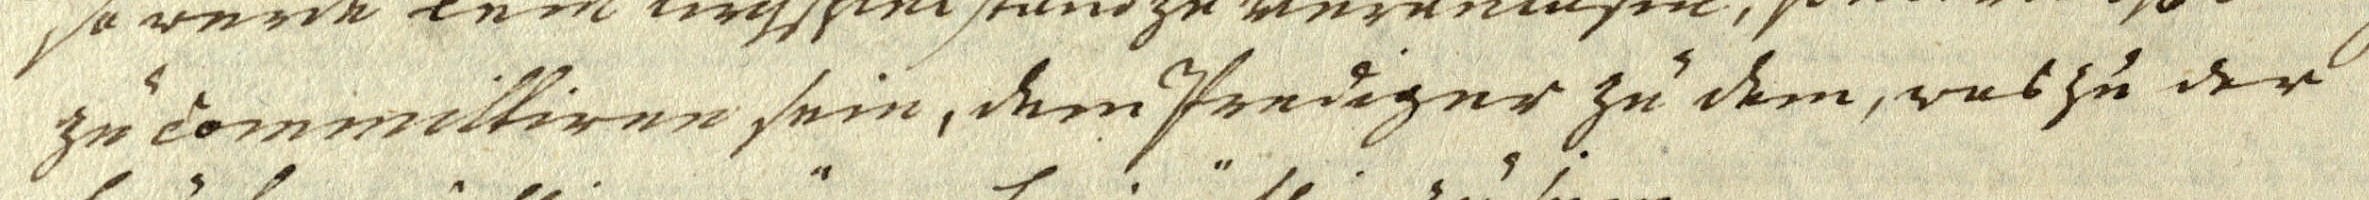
zu committiren sein, den Prediger zu dem, was zu der
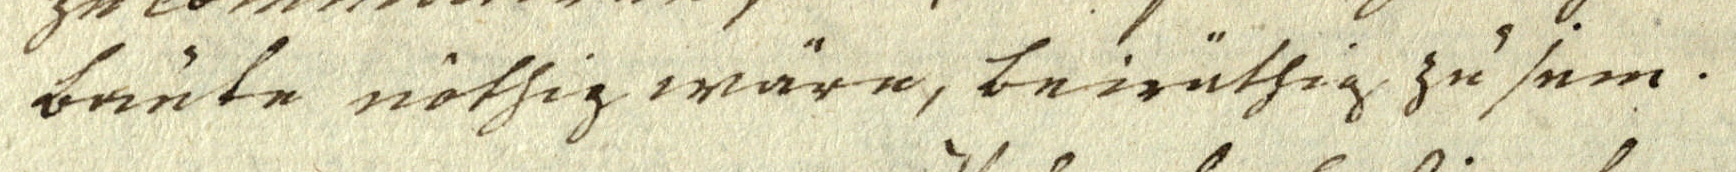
Baute nöthig wäre, beiräthig zu sein.
